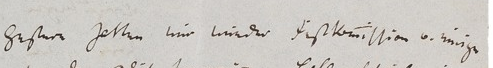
Gestern hatten wir wieder Festkommission &. einige
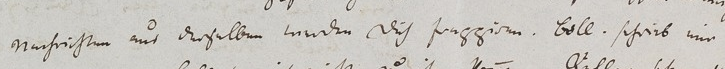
Nachrichten aus derselben werden Dich frappiren. Boll. schrieb mir
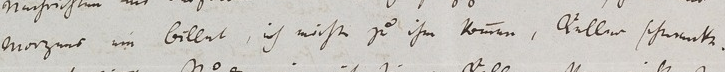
morgens ein Billet, ich möchte zu ihm kommen, Keller schwanke.
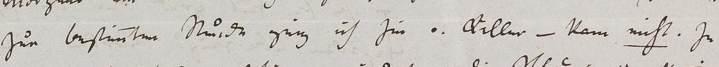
Zur bestimmten Stunde ging ich hin &.Keller – kam nicht. In
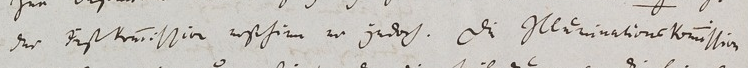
der Festkommission erschien er jedoch. Die Illuminationskommission
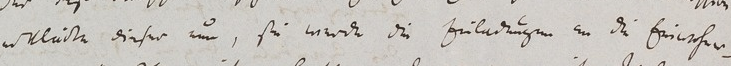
erklärte dieser nun, sie werde die Einladungen an die Einwohner-
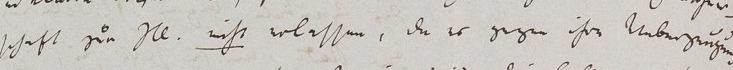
schaft zur Ill. nicht erlassen, da es gegen ihre Ueberzeugung
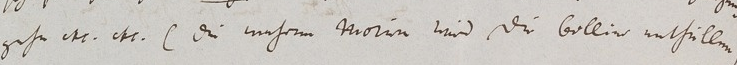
gehe etc. etc. (die wahren Motive wird Dir Bollier enthüllen,
